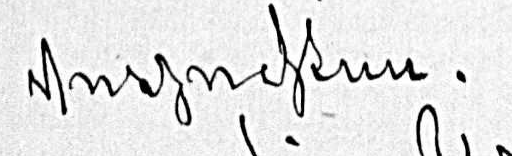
verzechten.
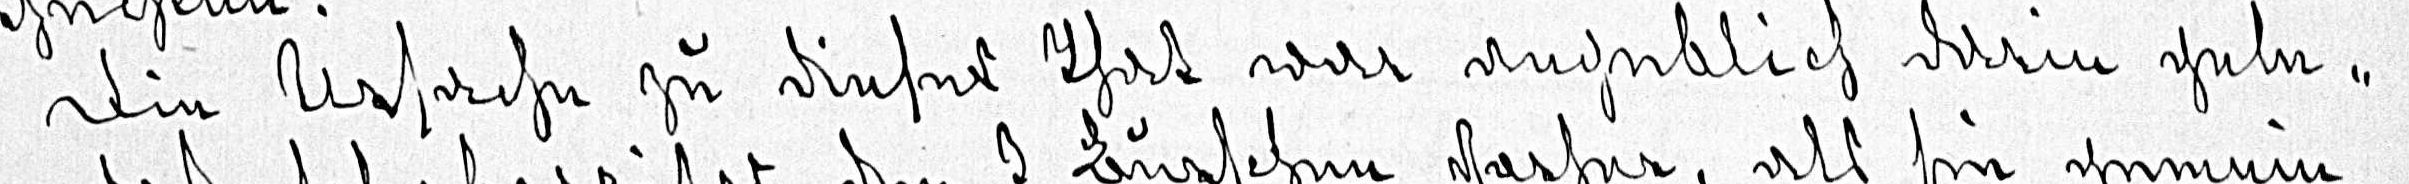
Die Ursache zu dieser That war angeblich darin gele¬
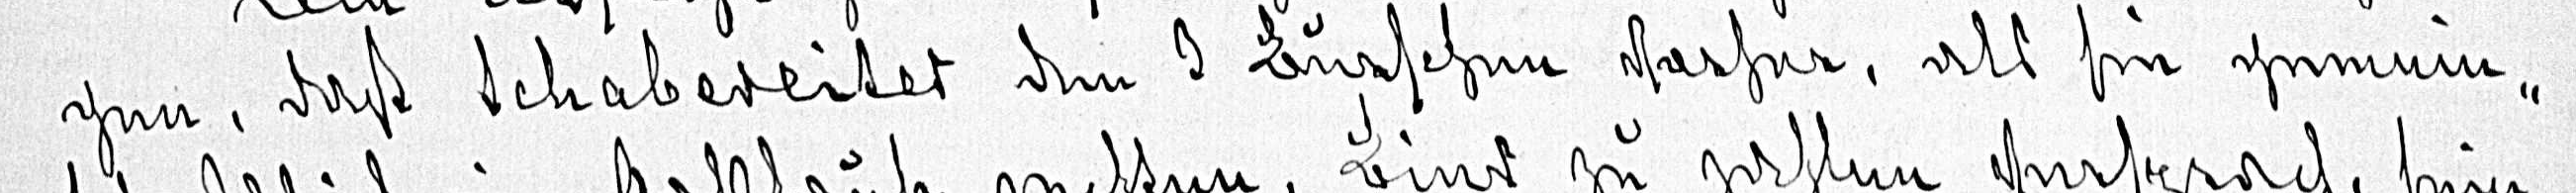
gen, daß Schabereiter den 3 Burschen vorher, als sie gemein¬
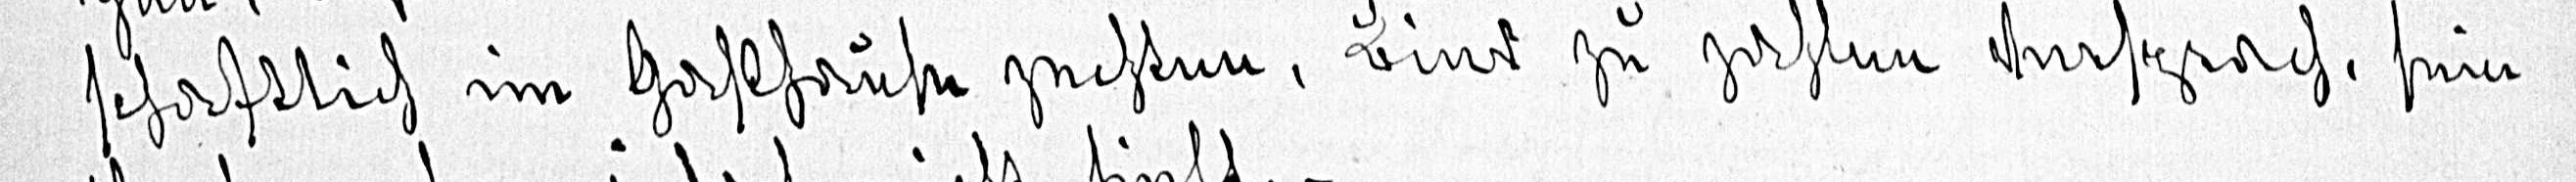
schaftlich in Gasthause zechten, Bier zu zahlen versprach, sein
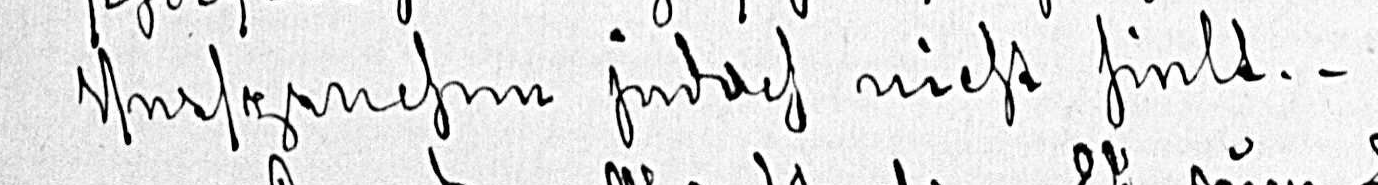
Versprechen jedoch nicht hielt.
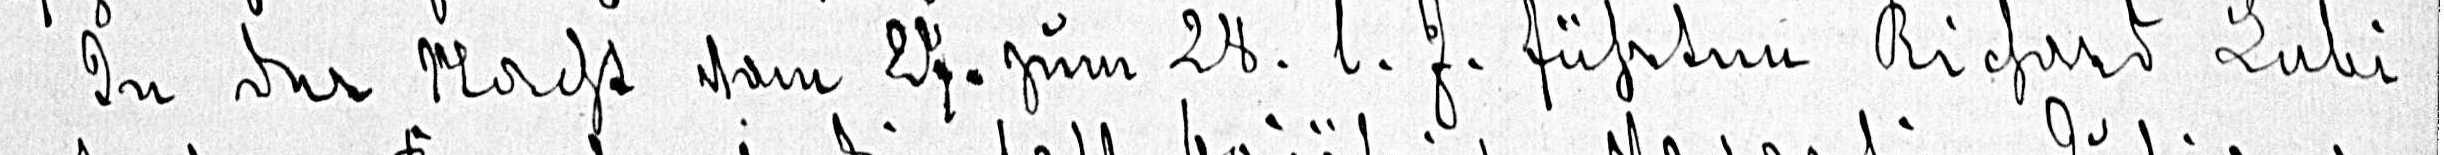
In der Nacht vom 27. zum 28. l. J. führten Richard Lubi
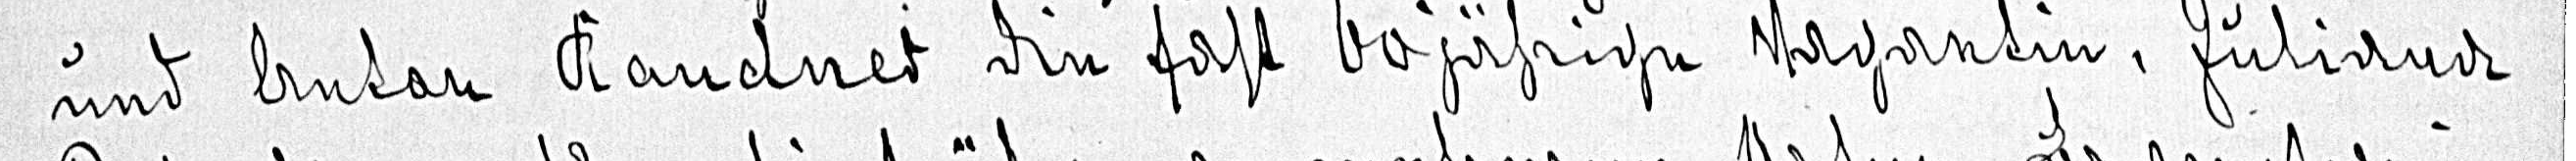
und Anton Raudner die fast 60jährige Vagantin, Juliana
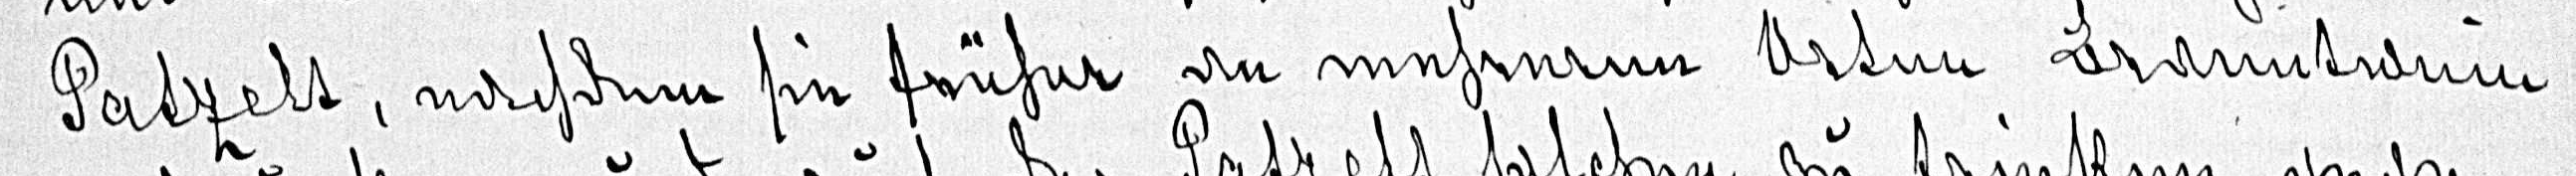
Patzelt, nachdem sie früher an mehreren Orten Branntwein
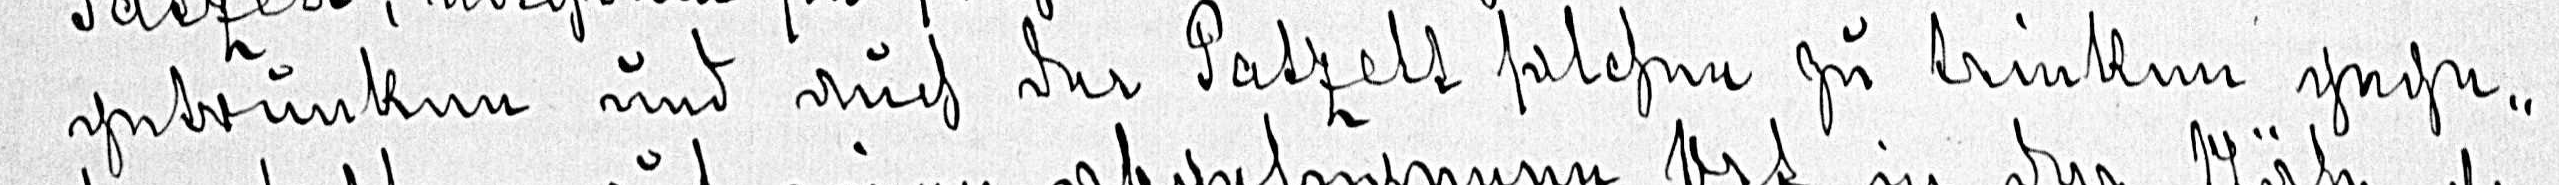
getrunken und auch der Patzelt solche zu trinken gege¬
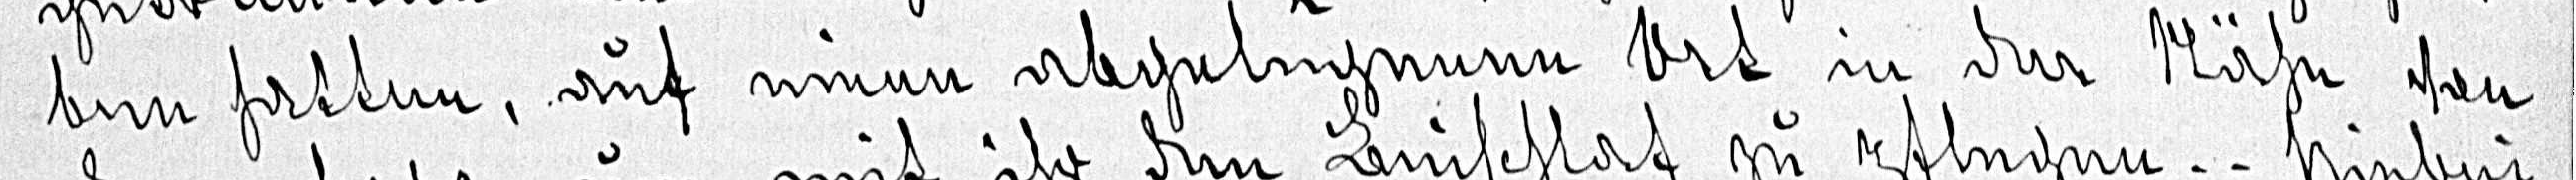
ben hatten, auf einen abgelegenen Ort in der Nähe von
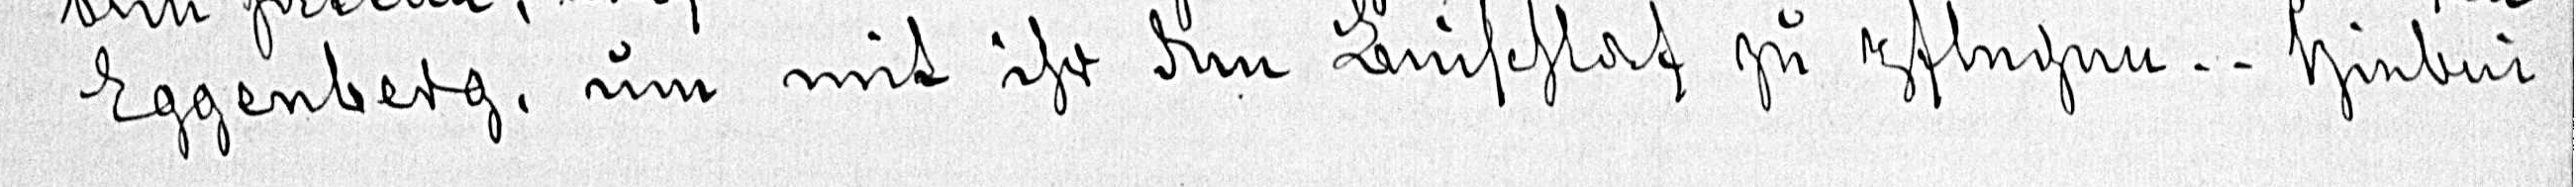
Eggenberg, um mit ihr den Beischlaf zu pflegen. Hiebei
